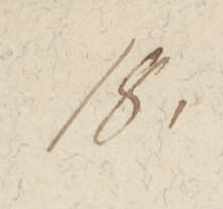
18.
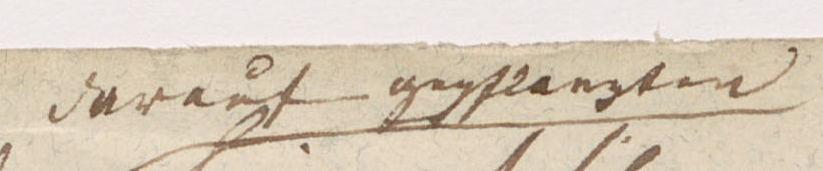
darauf gepflanzten
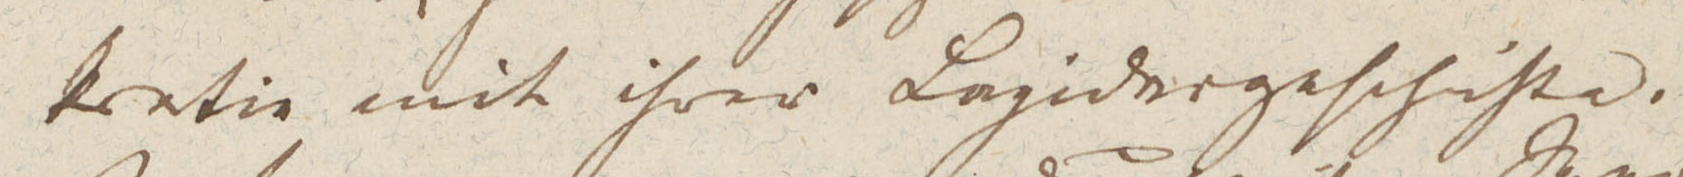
kratie mit ihrer Lapidargeschichte.
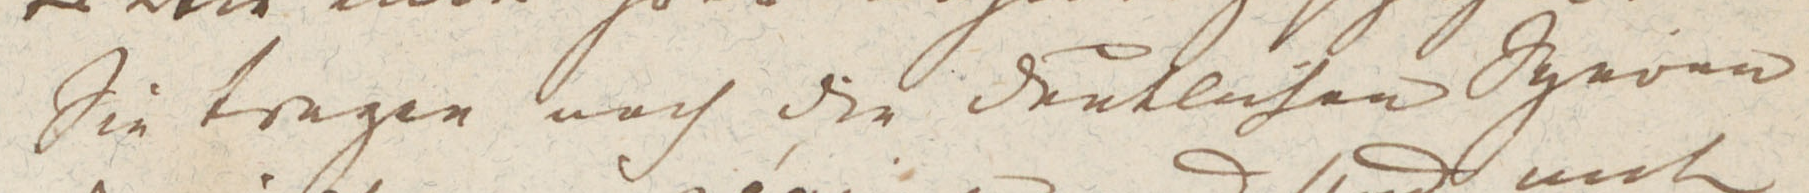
Sie tragen noch die deutlichen Spuren
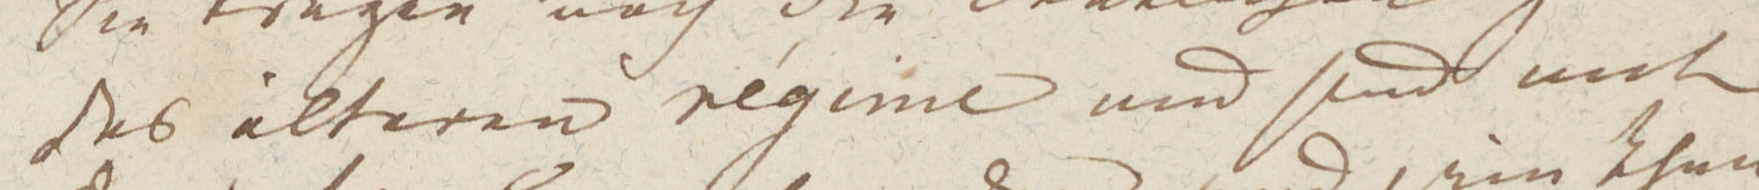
des älteren régime und sind mit
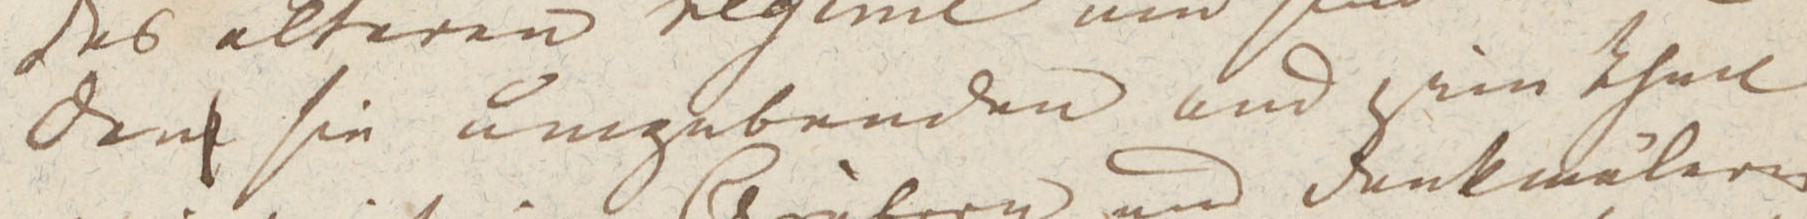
demn sie umgebenden und zum Theil
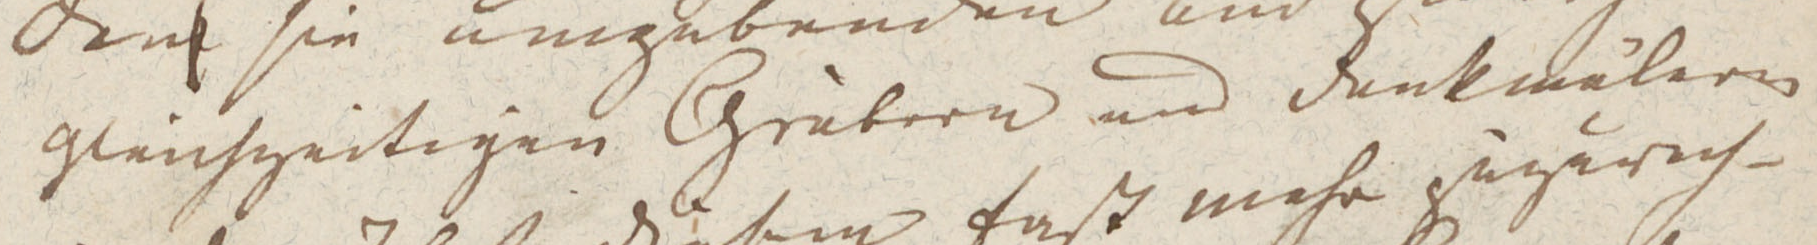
gleichzeitigen Gräbern und Denkmälern
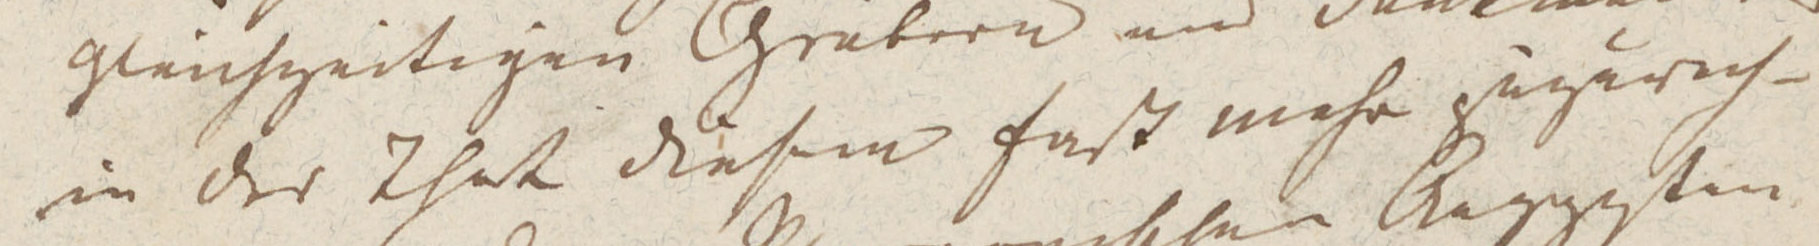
in der That diesem fast mehr zuzurech-
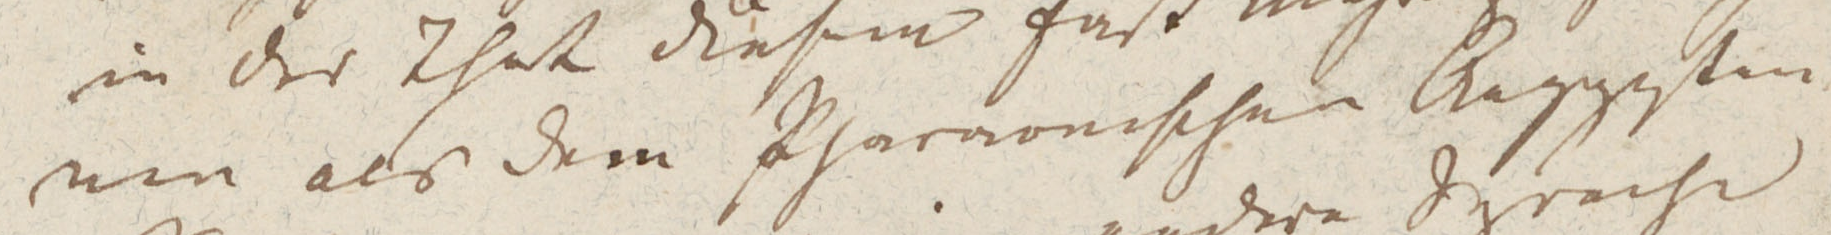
nen als dem Pharaoinischen Aegypten
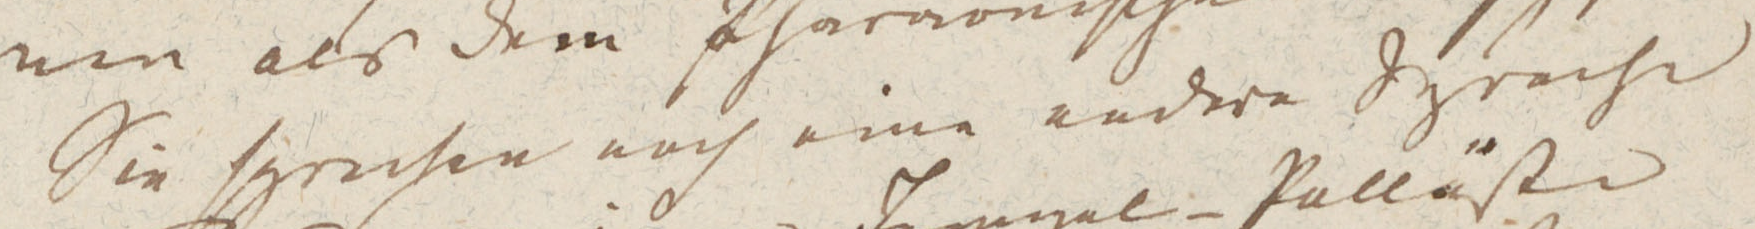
Sie sprechen noch eine andere Sprache
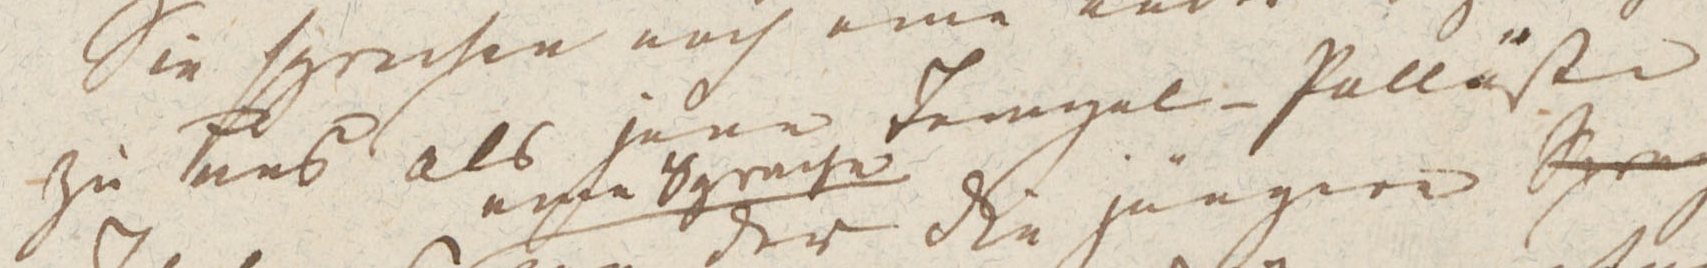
zu uns als jene Tempel-Palläste
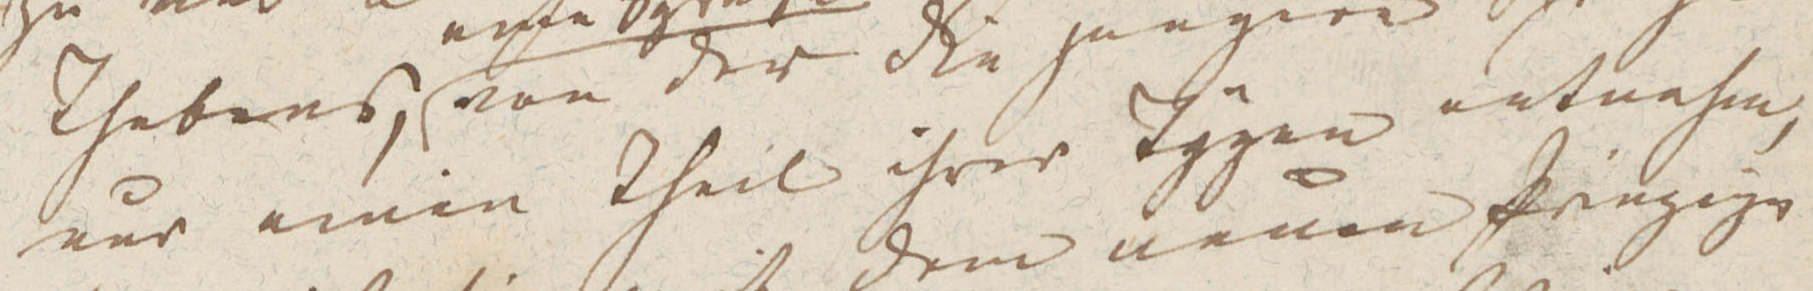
nur einen Theil ihrer Typen entnahm,
